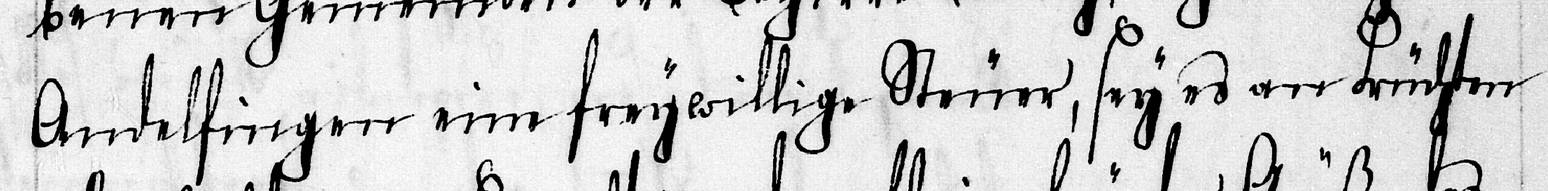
Andelfingen eine freywillige Steuer, sey es an Früchten
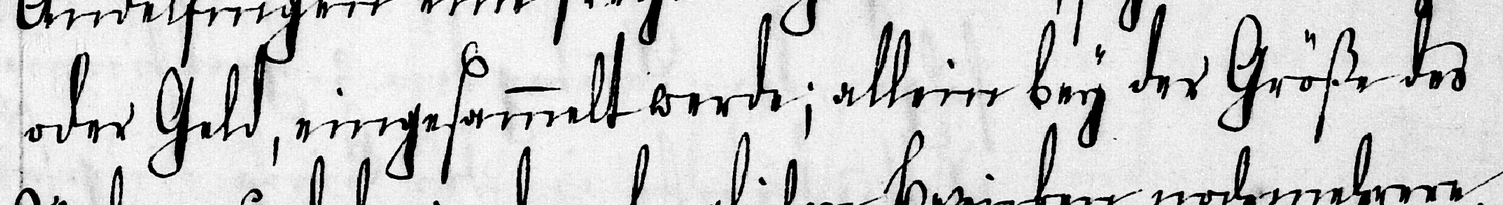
oder Geld, eingesammelt werde; allein bey der Größe des
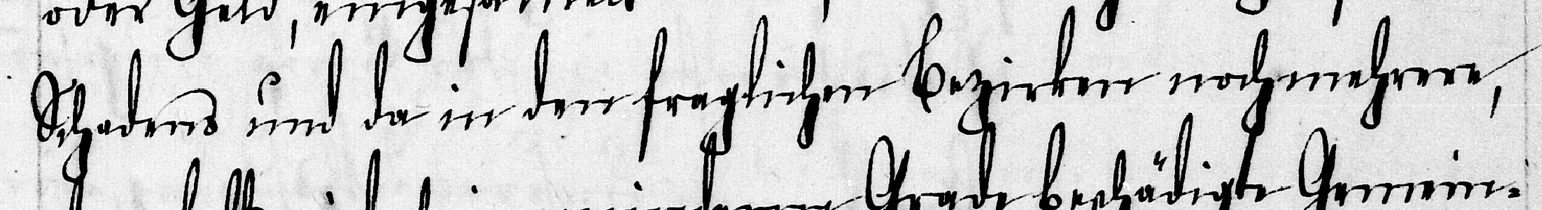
Schadens und da in den fraglichen Bezirken noch mehrere,
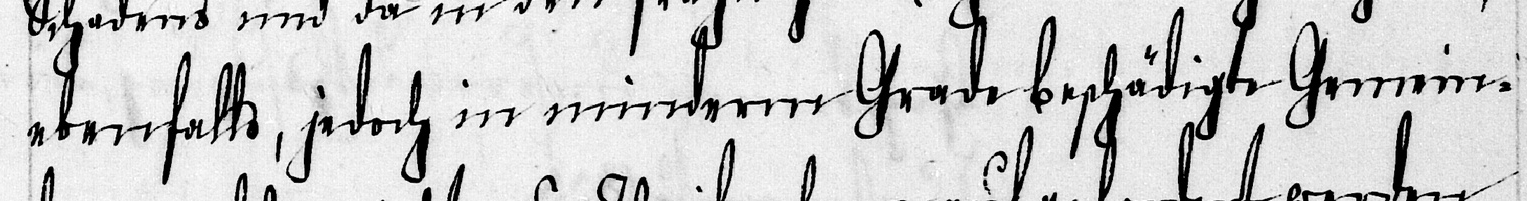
ebenfalls, jedoch in minderm Grade beschädigte Gemein¬
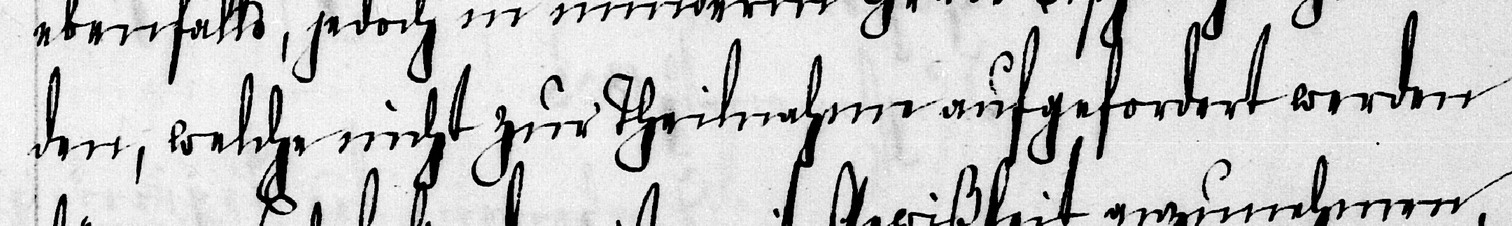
den, welche nicht zur Theilnahme aufgefordert werden
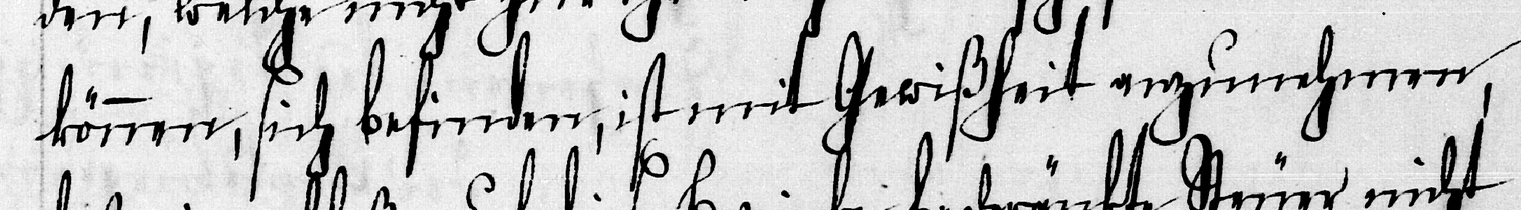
können, sich befinden, ist mit Gewißheit anzunehmen,
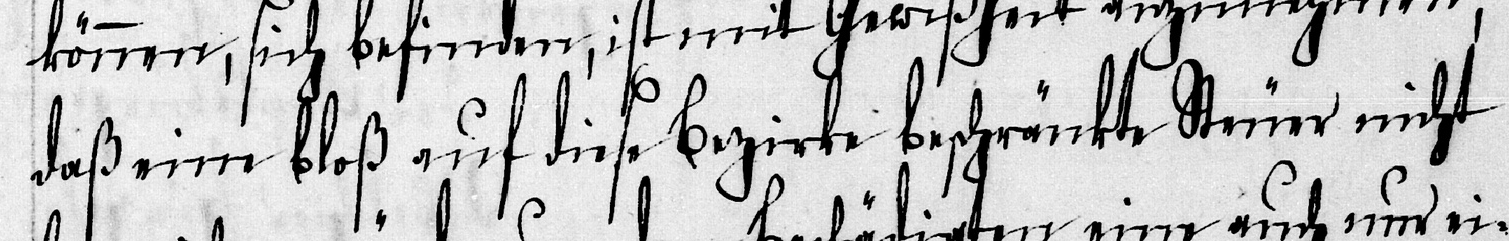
daß eine bloß auf diese Bezirke beschränkte Steuer nicht
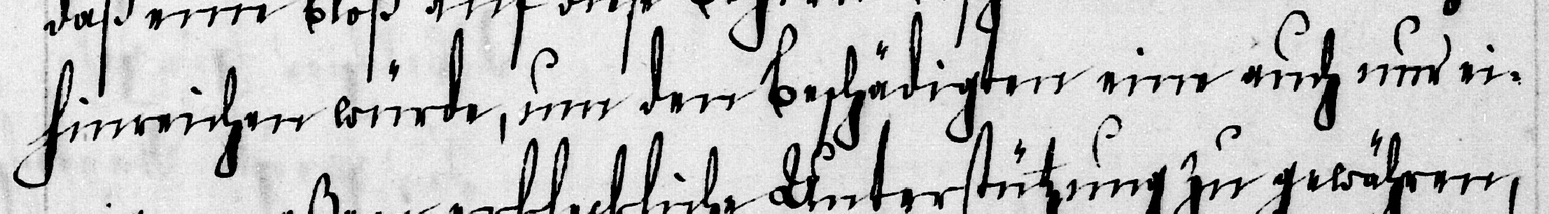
hinreichen würde, um den Beschädigten eine auch nur ei¬
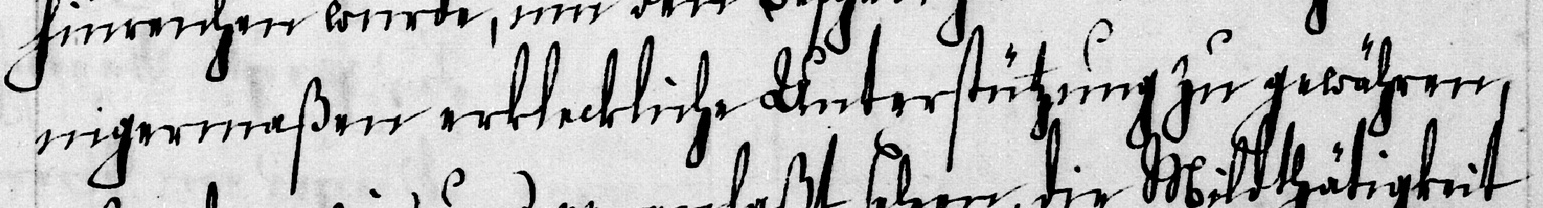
nigermaßen erkleckliche Unterstützung zu gewähren,
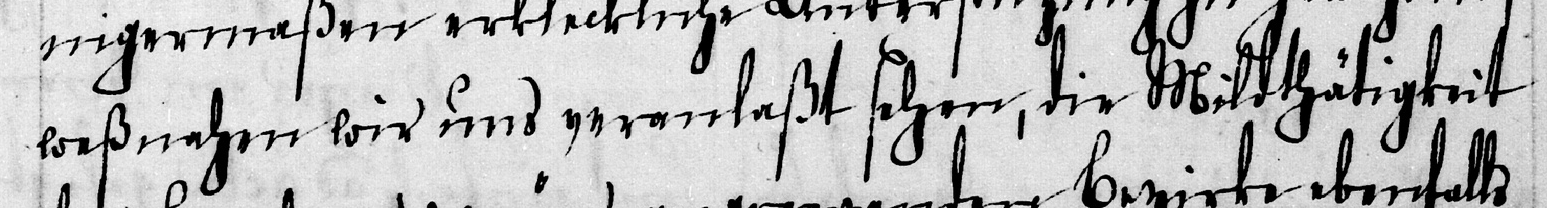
weßnahen wir uns veranlaßt sehen, die Mildthätigkeit
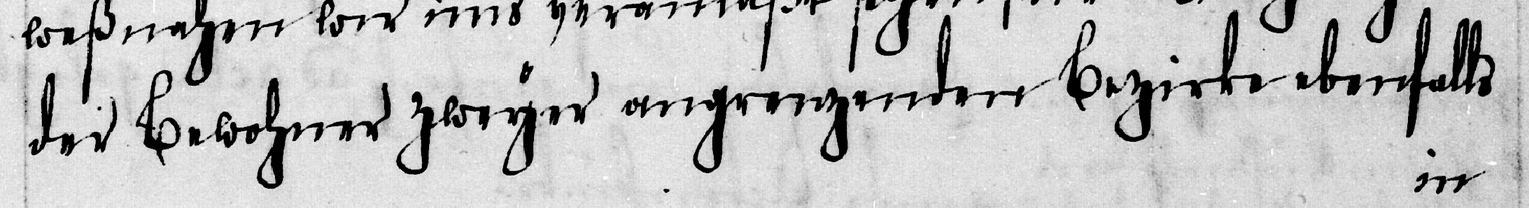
der Bewohner zweyer angrenzenden Bezirke ebenfalls
